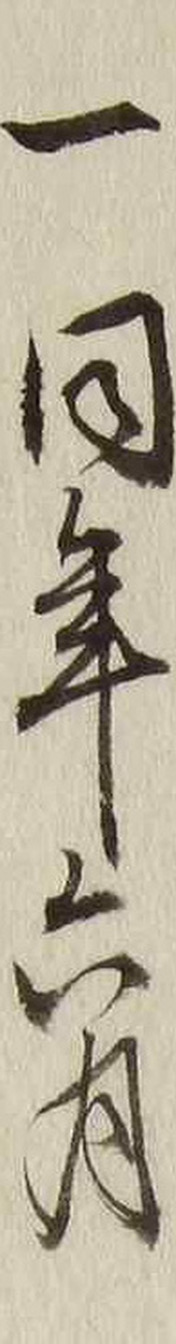一同年六月
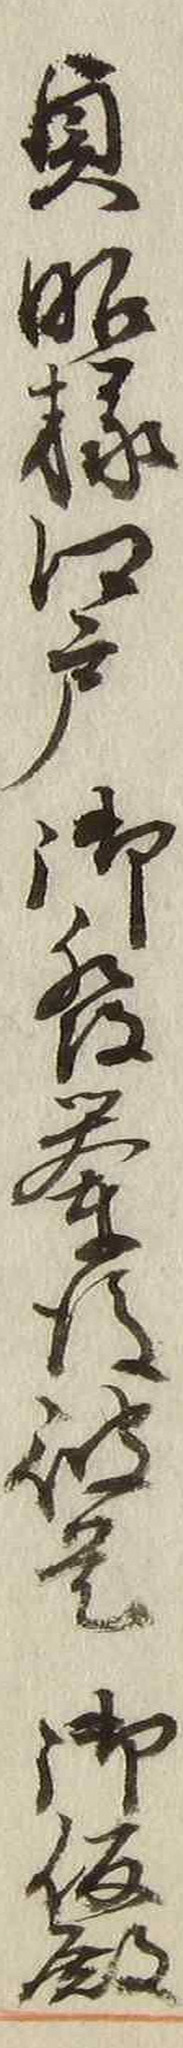貞昭様江戸御発後彼是御仮殿
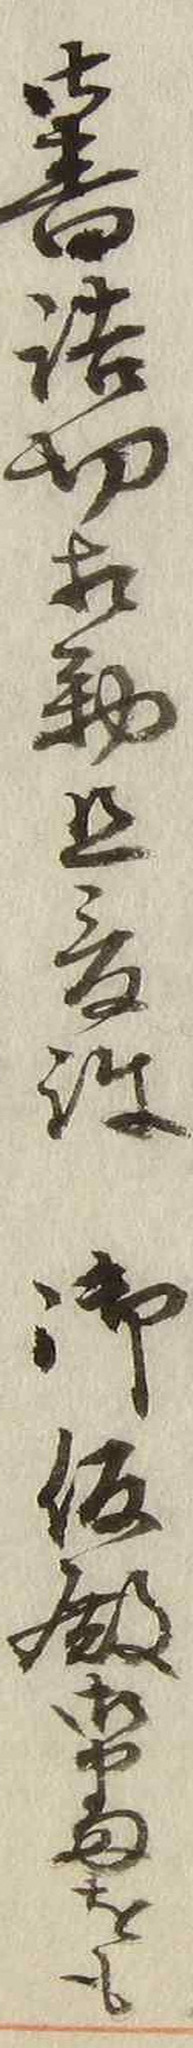御番詰切相勤旦爰許御仮殿御番をも
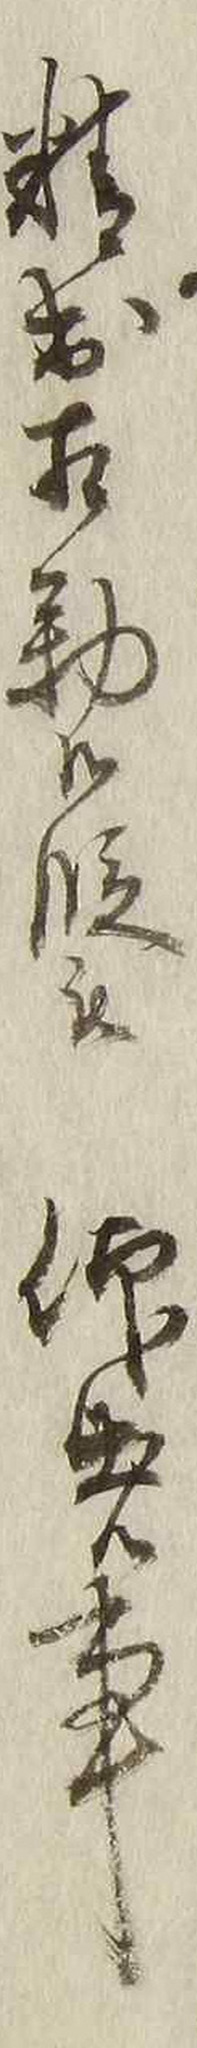精出相勤候段被仰出候事
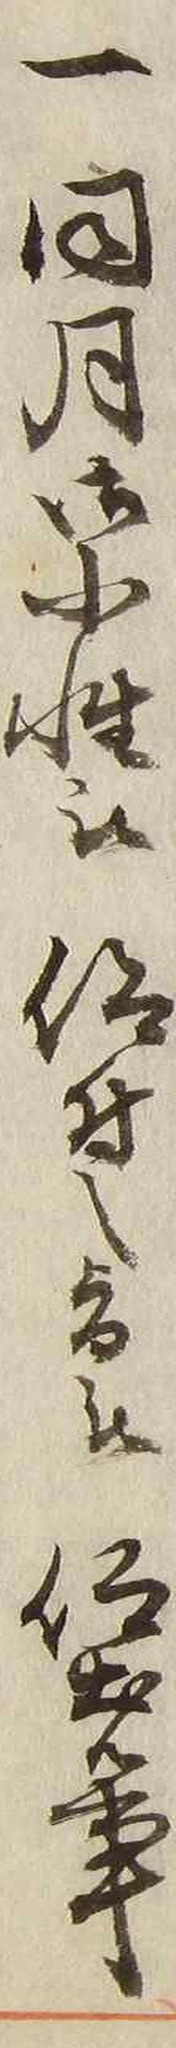一同月御小性被仰付之旨被仰出候事
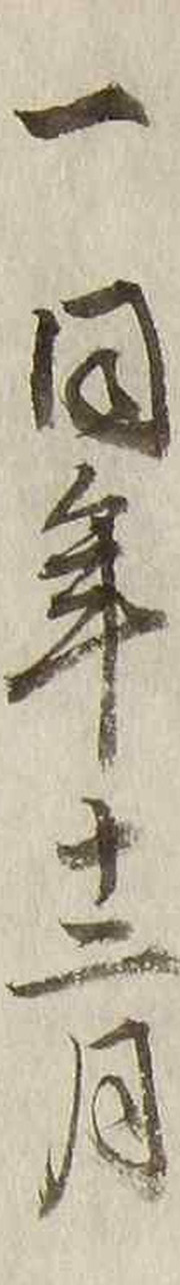一同年十二月
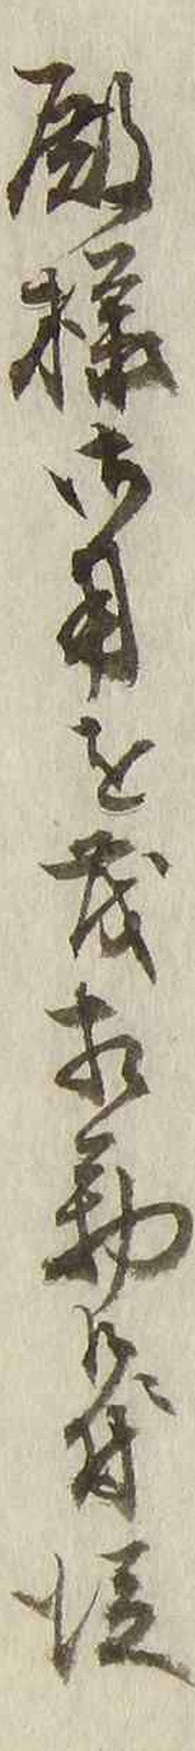殿様御用を茂相勤候ニ付従

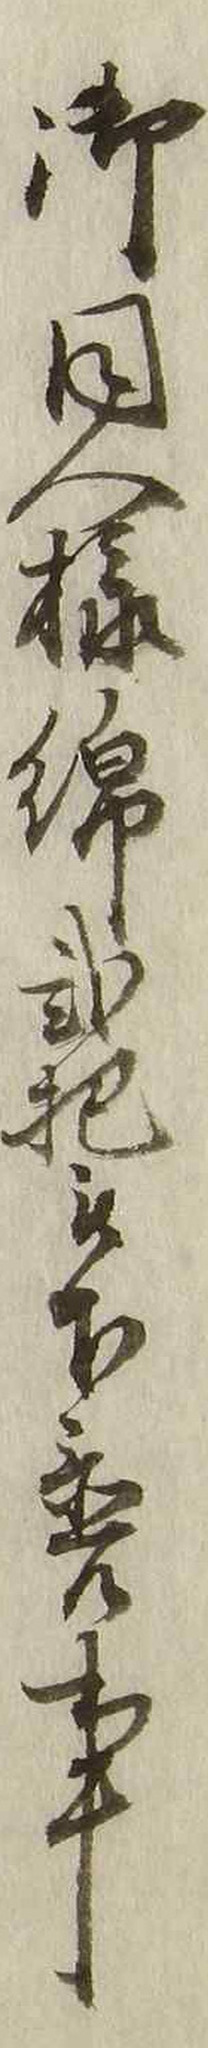御同人様綿弐把被下置候事
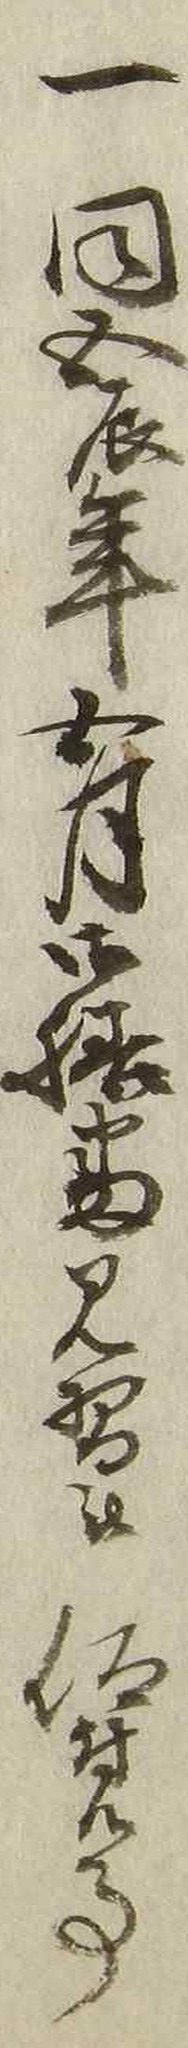一同五辰年五月御膳番見習被仰付候事
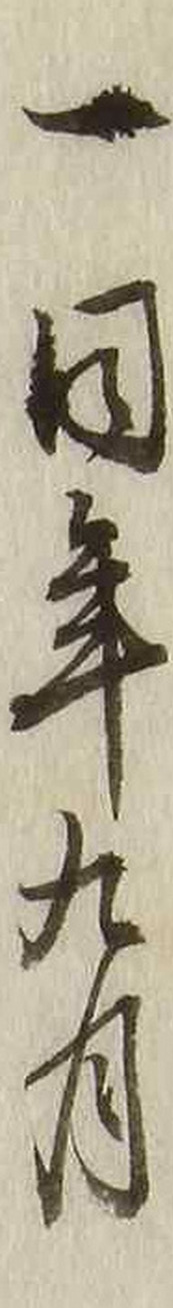一同年九月
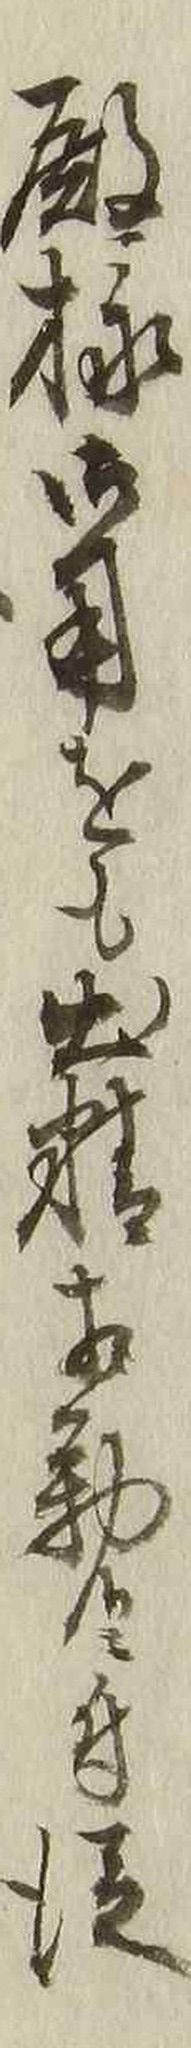殿様御用をも出精相勤候ニ付従
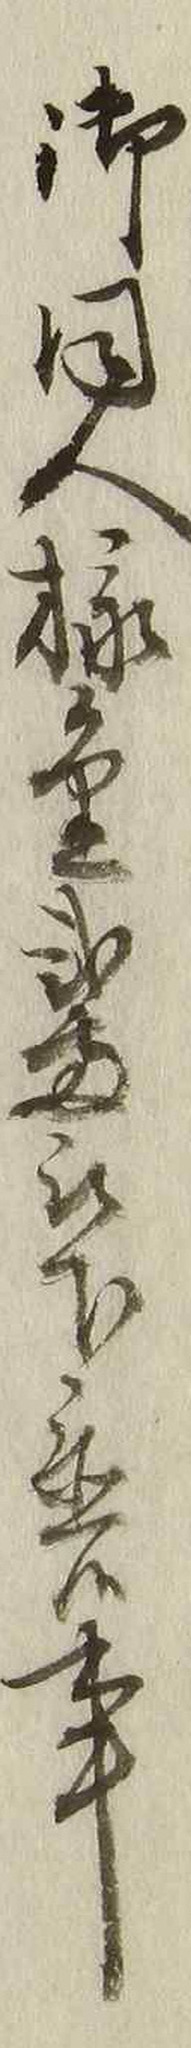御同人様金弐両被下置候事
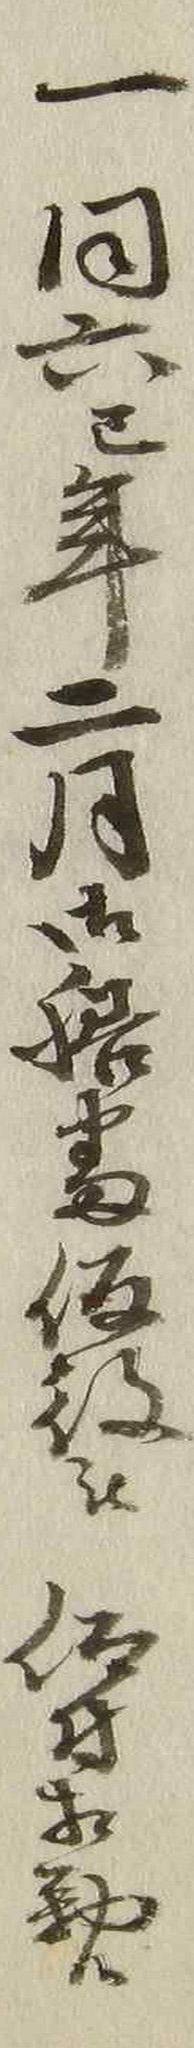一同六巳年二月御膳番仮役被仰付相勤候
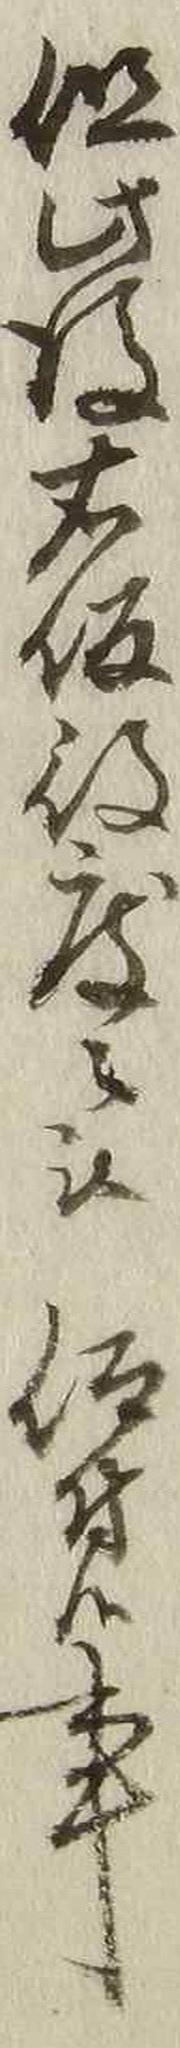但此後右仮役度々被仰付候事
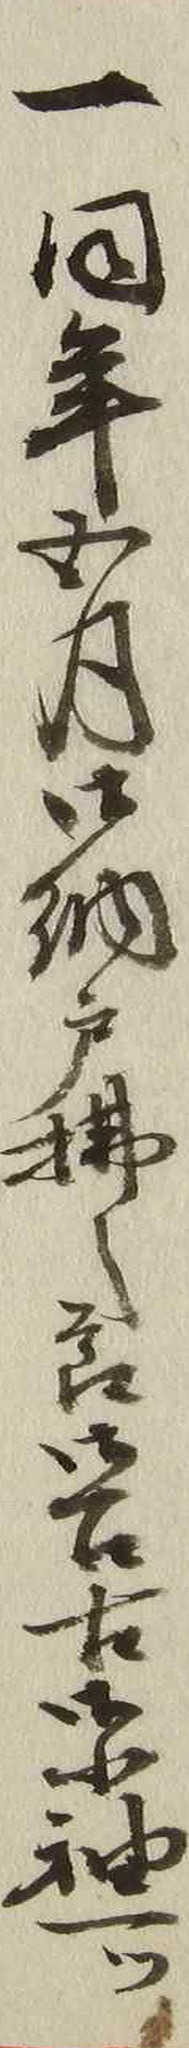一同年五月御納戸払之節御召古御小袖一ツ
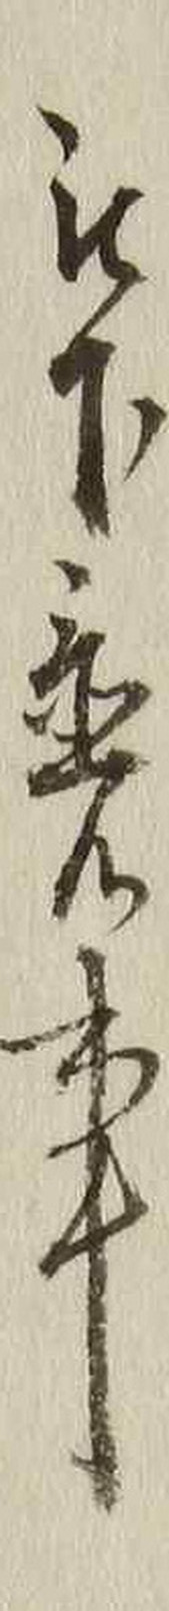被下置候事
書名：諸士系譜　巻之23　い之部23
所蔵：会津若松市立会津図書館
